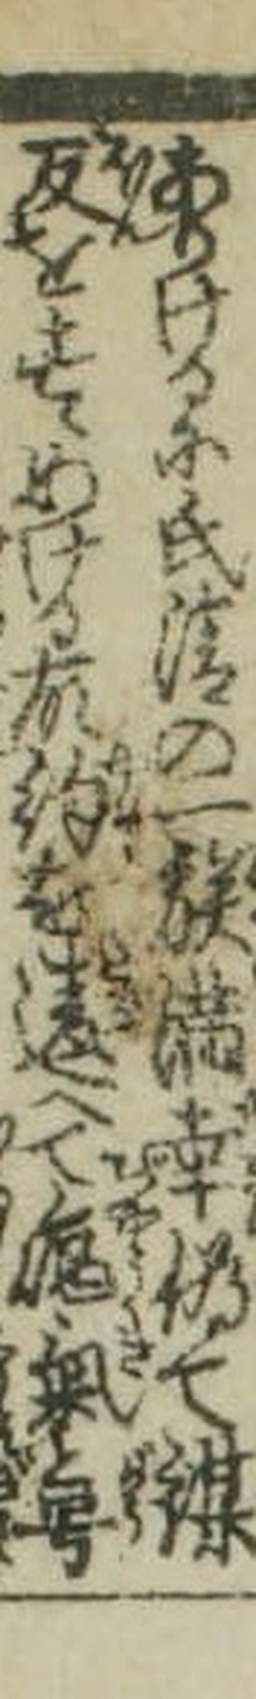反をすゝめける故約を違へて病気と号
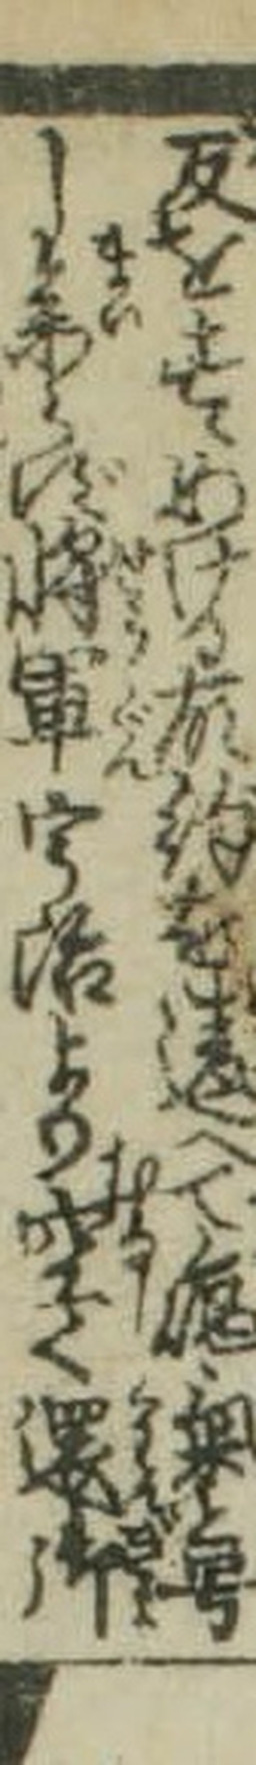し参らず将軍宇治より空く還御
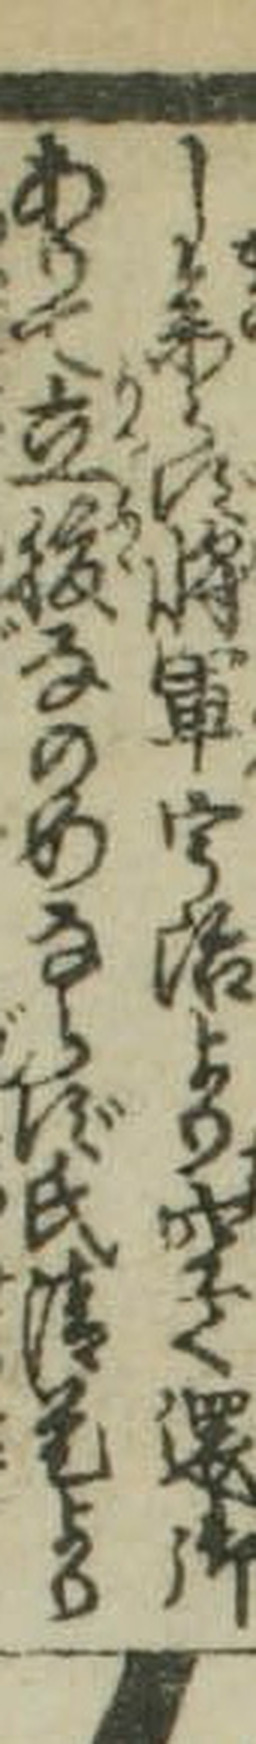ありて立腹なのめならず氏清是より
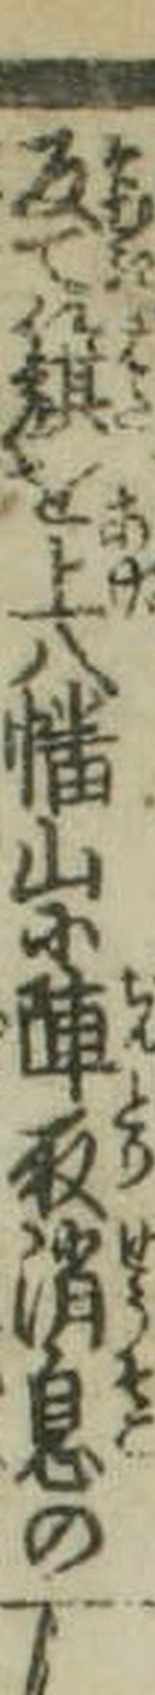反て旗を上八幡山に陣取消息の
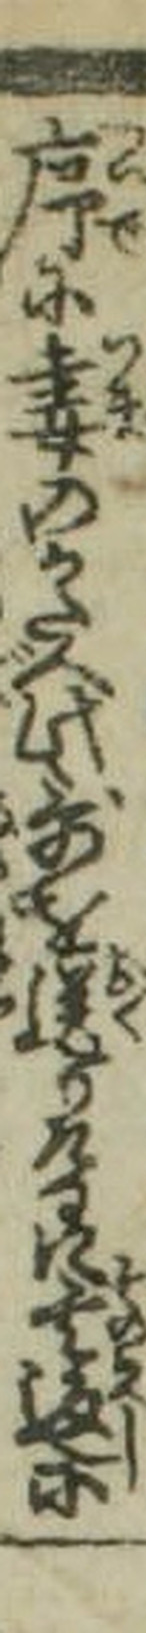序に妻のかたへ此哥を送りけるに其返に
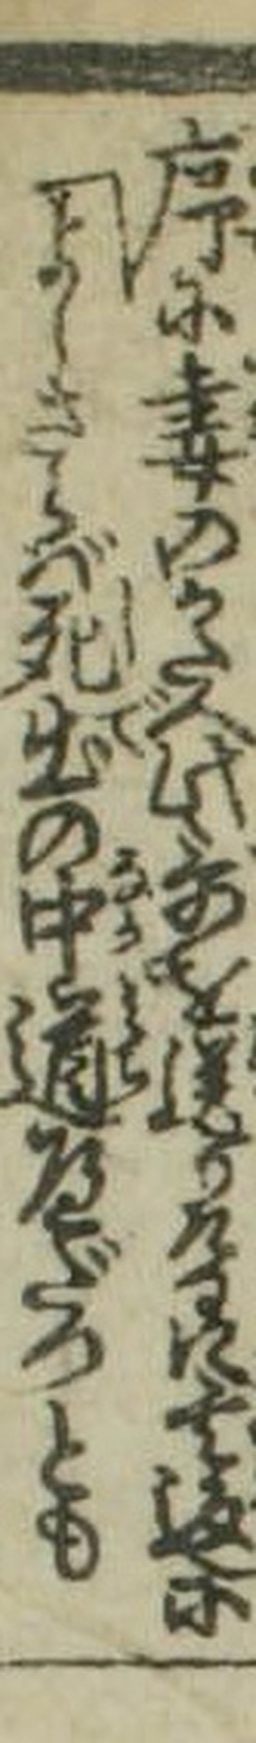〽よしさらば死出の中道へだつとも
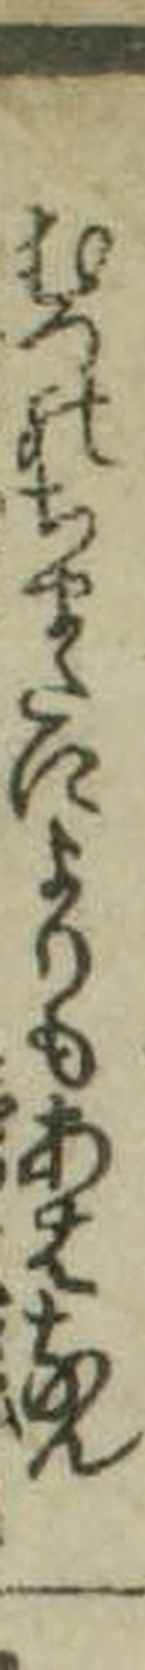むつのちまたによりもあはなん
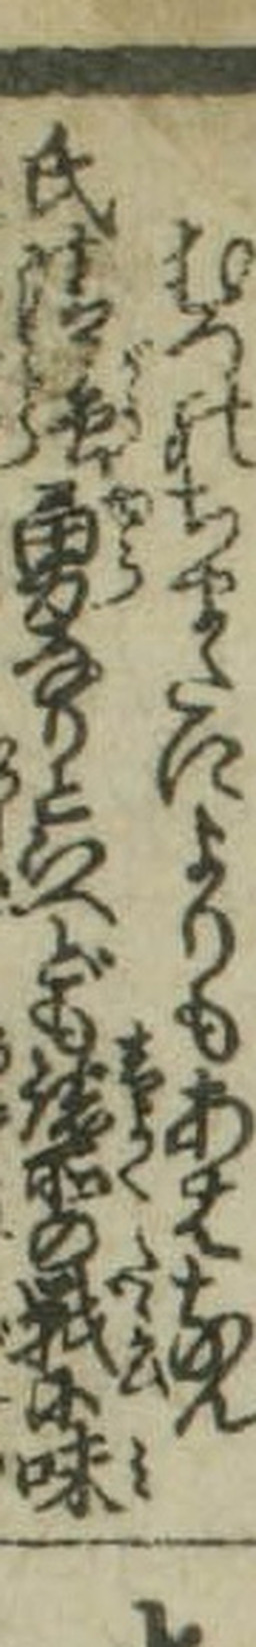氏清強勇なりといへども諸所の戦に味
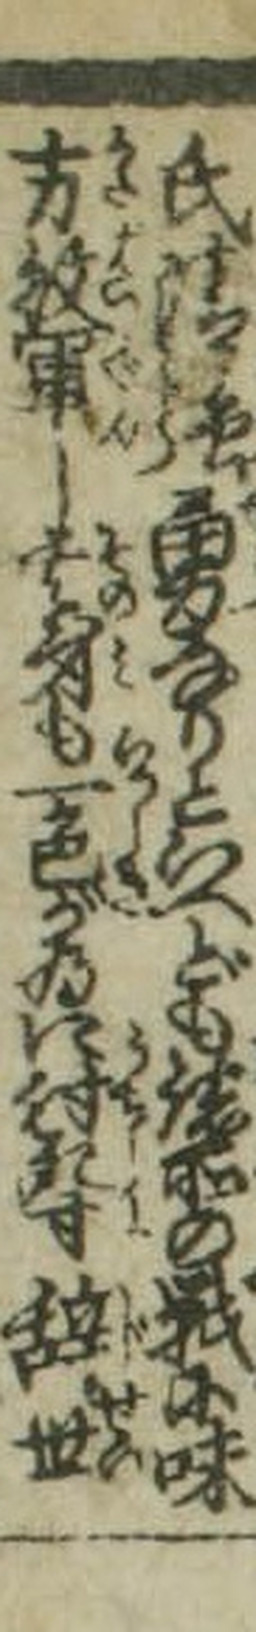方敗軍し其身も一色が為に討死す辞世
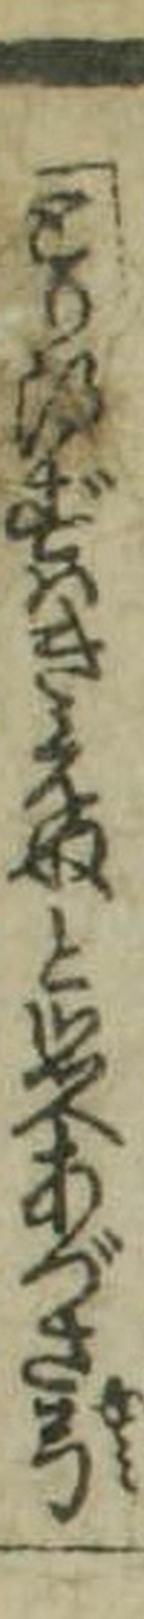〽とり得ずはきえぬと思へあずさ弓
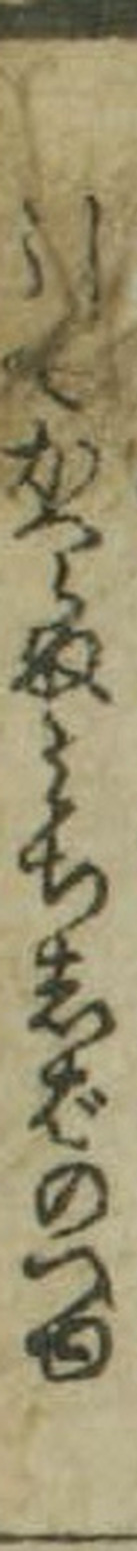引てかへらぬみちしばのつゆ
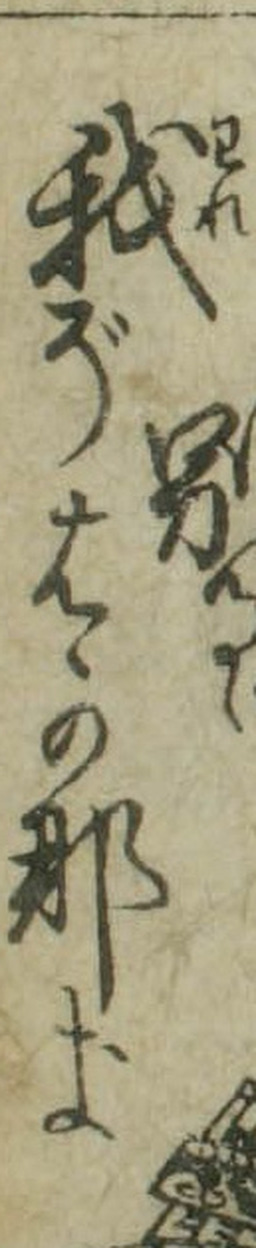我ぞはかなき

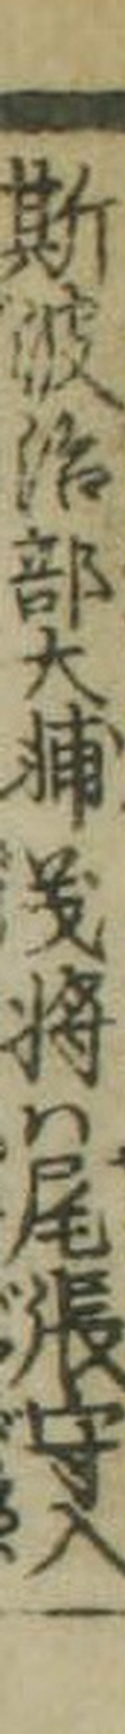斯波治部大輔義将は尾張守入
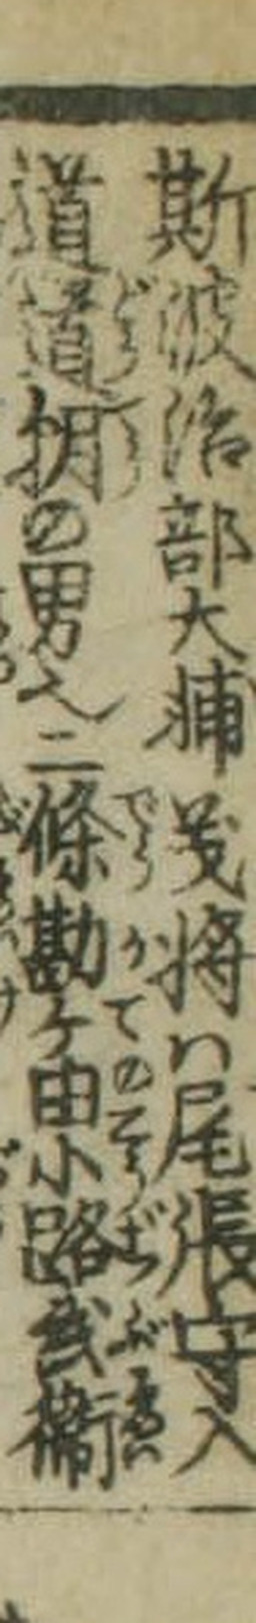道道朝の男也二条勘ケ由小路武衞
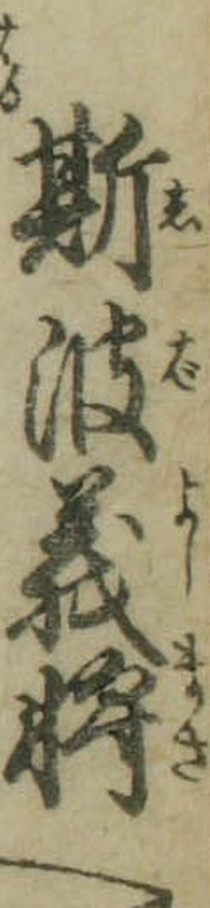斯波義将
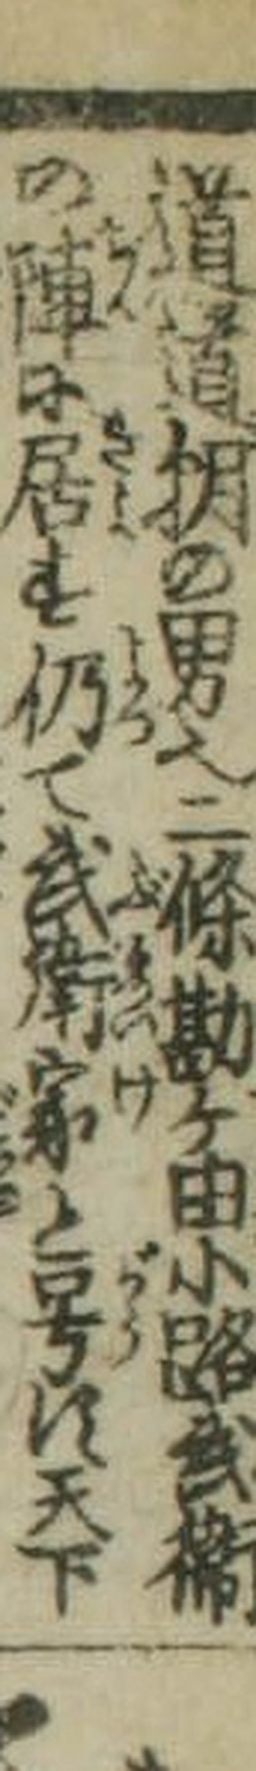の陣に居す仍て武衞家と号す天下
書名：續英雄百人一首
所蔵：東京学芸大学附属図書館
